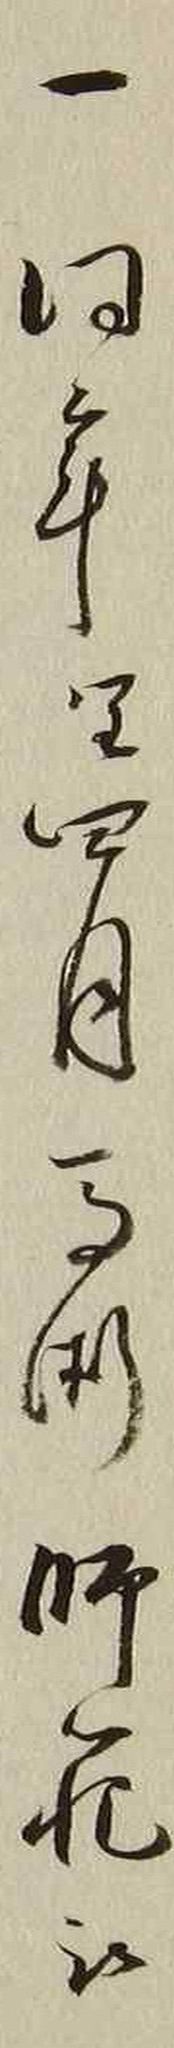一同年閏四月馬術師範被
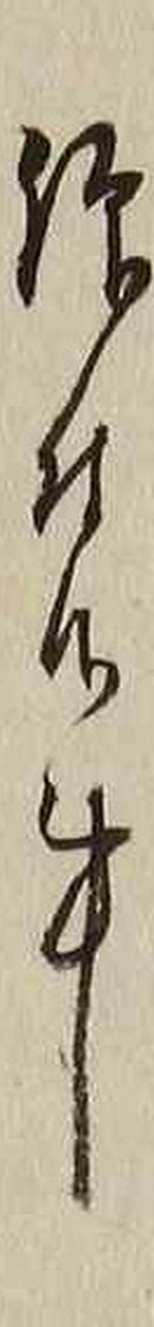仰付候事
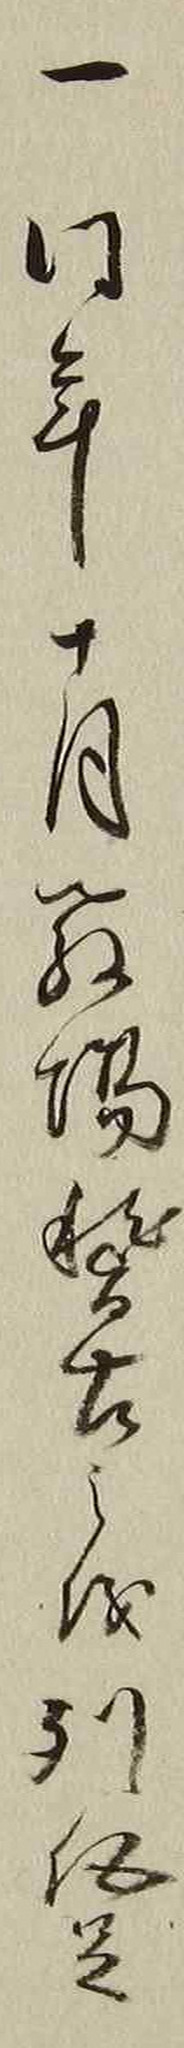一同年十月教場稽古之儀列伍足
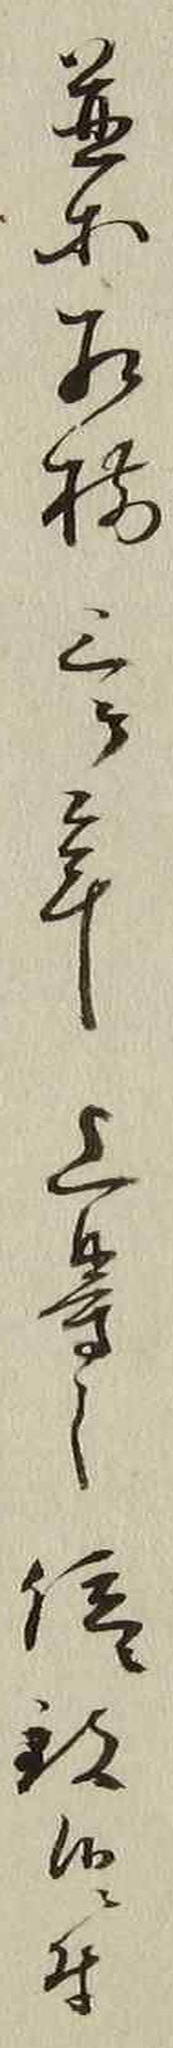並等相揃三ケ年上等之位ニ致候ニ付
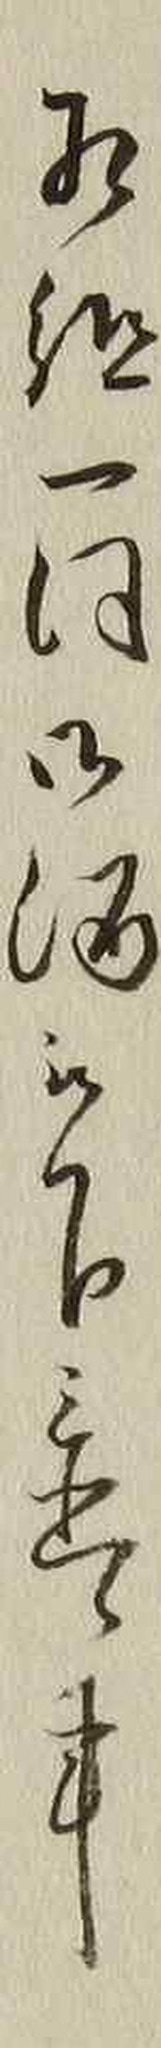相組一同御酒被下置候事
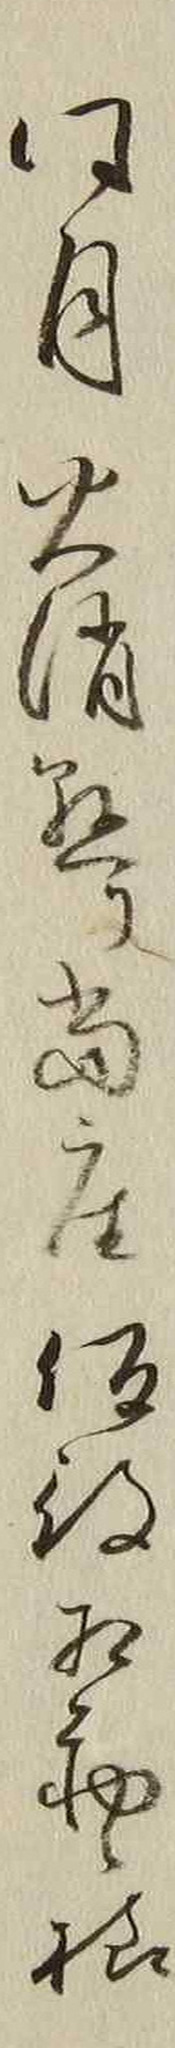一同月火消懸り当座仮役相勤候様
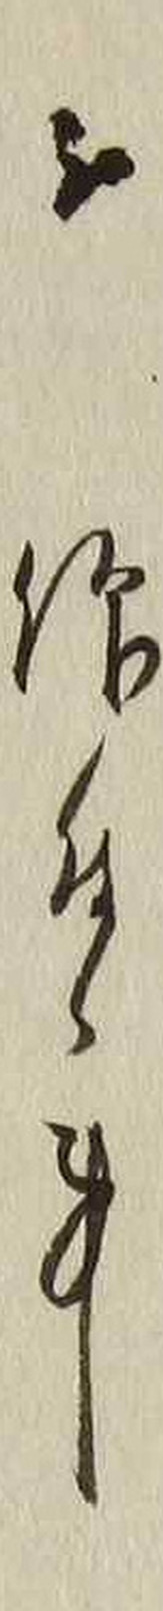被仰付候事
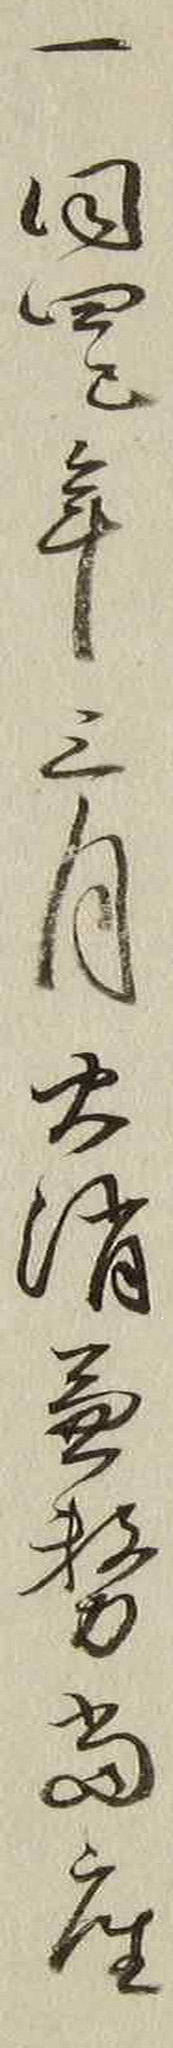一同四巳年三月火消兼務当座
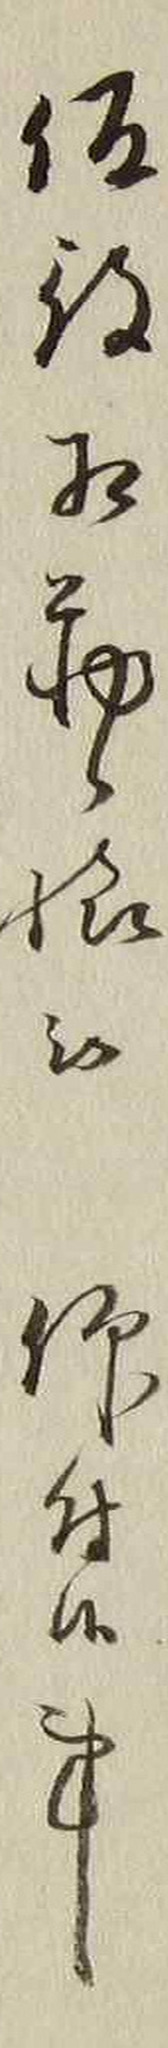仮役相勤候様被仰付候事
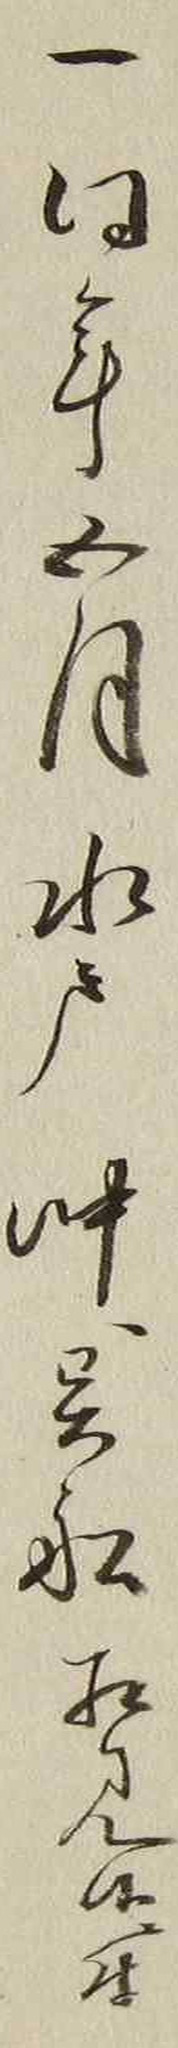一同年五月水戸沖へ異船相見候ニ付
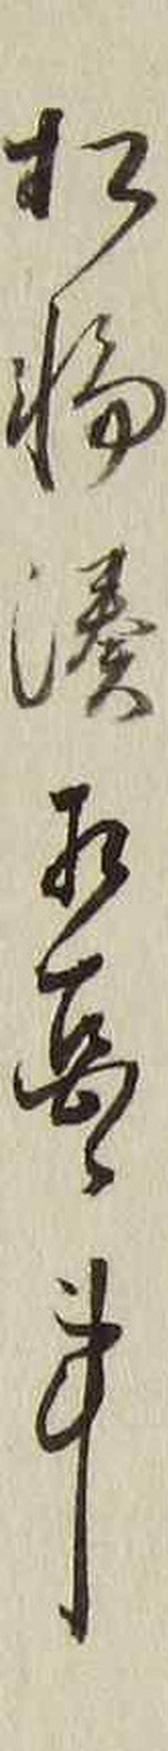松輪湊相固候事
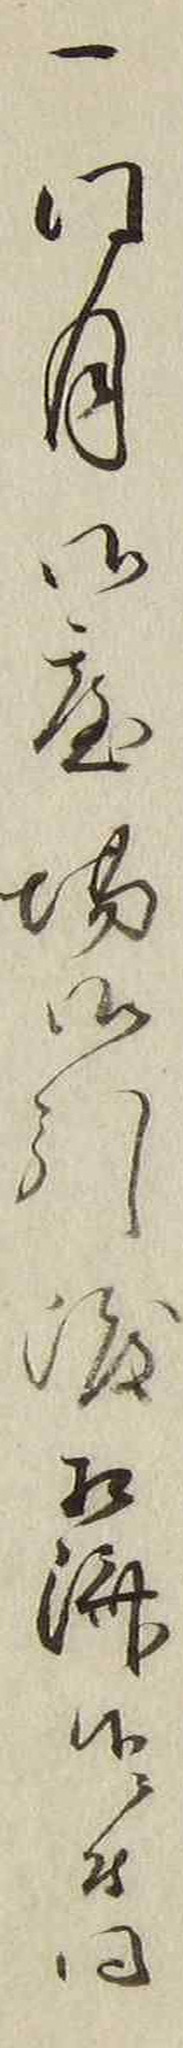一同月御台場御引渡相済候ニ付同
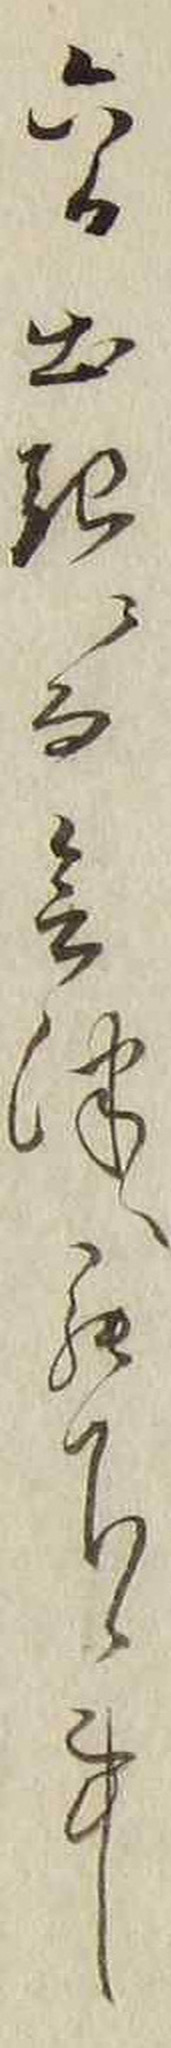六日出起ニ而会津へ罷下候事

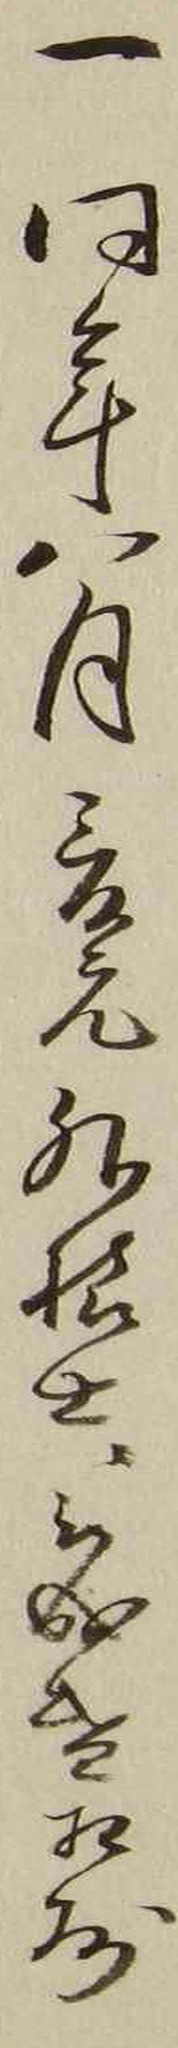一同年八月爰元外様士ニ被成替相州
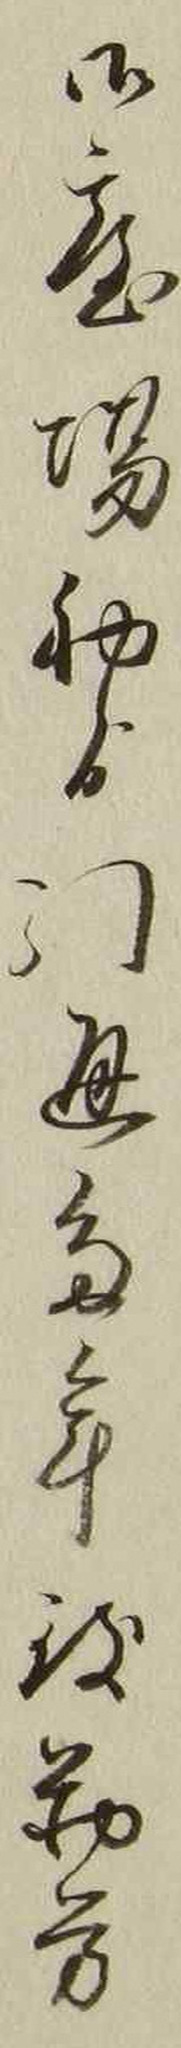御台場初ゟ引通多年致勤労
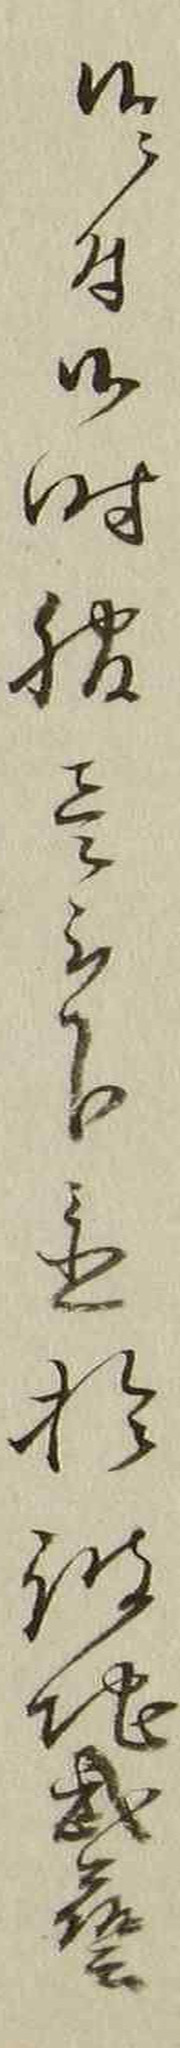候ニ付御時服壱被下置於彼地弐芸
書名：諸士系譜　巻之28　い之部28
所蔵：会津若松市立会津図書館
